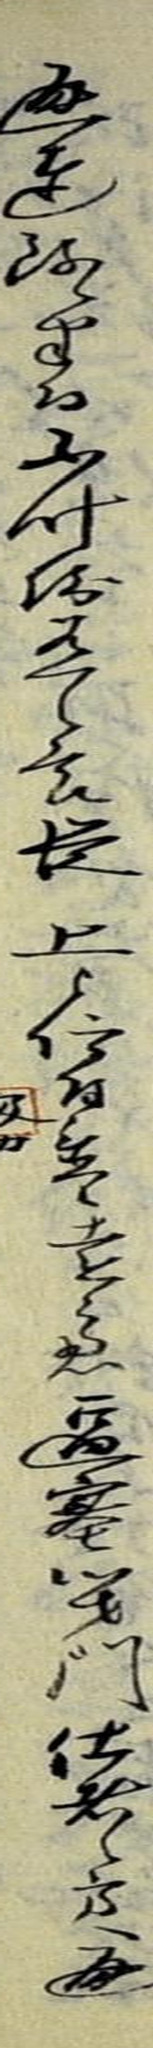通達致候半而不叶儀有之節従上被仰付置候遠慮逼塞閉門仕者之方へ通
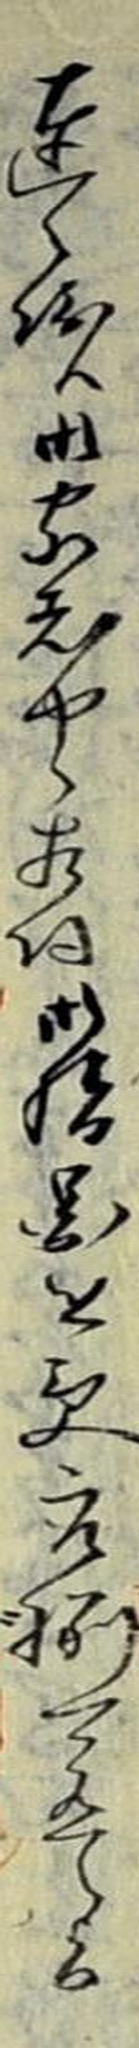達之儀ハ御家老中へ相伺御指図を受取捌可有之旨
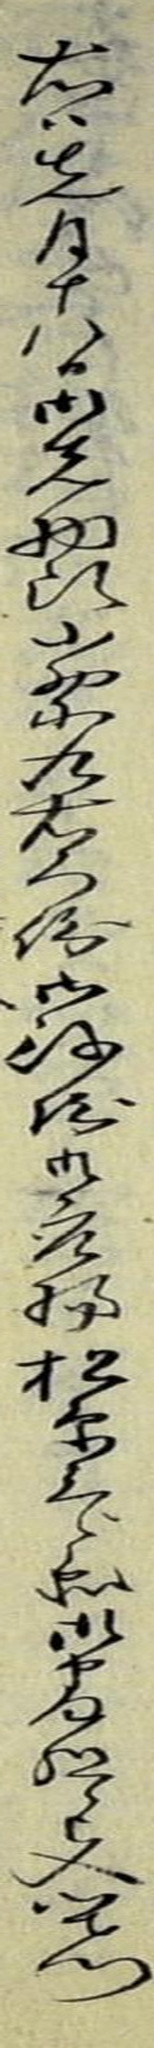右ハ先月十八日御先物頭小栗九右衛門儀御役儀御取揚松原三郎兵衛御番組へ被入閉門
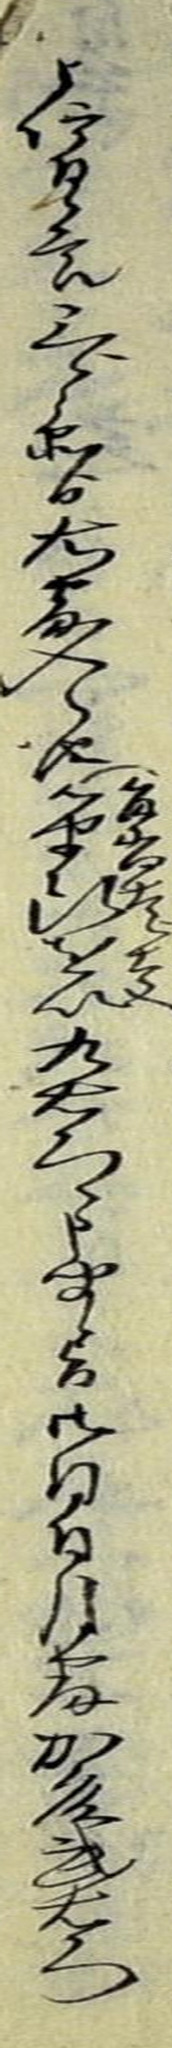被仰付候節三郎兵衛ゟ右番入之儀筆頭―梁田太郎大夫を以九右衛門へ申聞候旨御目付月番加藤武右衛門
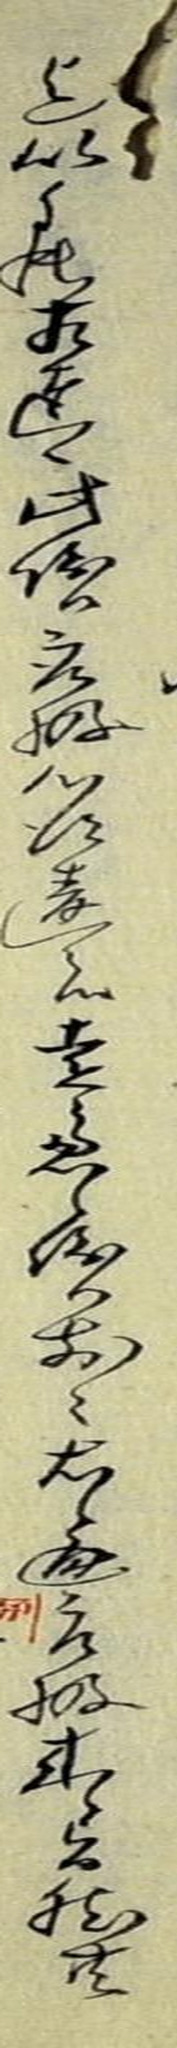迄以手紙相達候此儀ハ取扱心得違ニ候遠慮之儀ハ前々右之通取扱来候旨然共
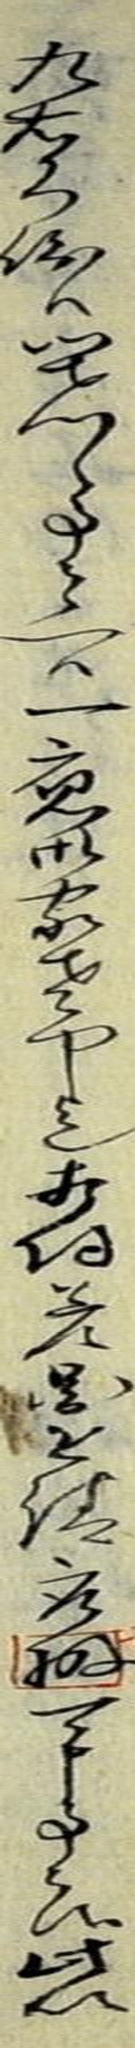九右衛門儀ハ閉門之事ニ候ヘハ一応御家老中迄相伺差図を請取扱捌可申事ニ候此以
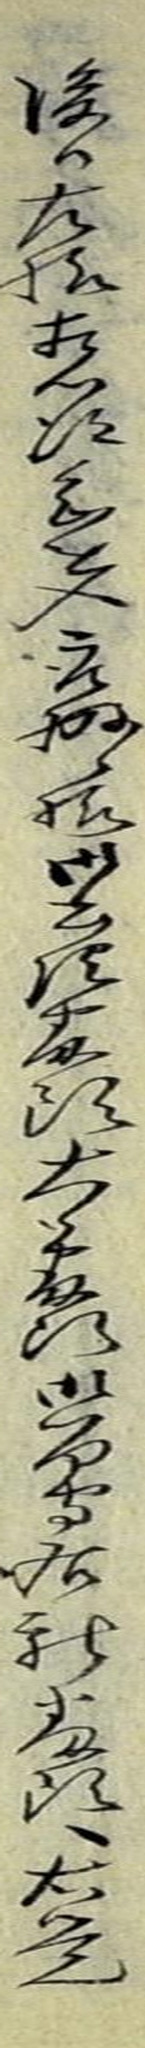後ハ左様相心得念を入取扱候様御書院番頭大御番頭御留守居新番頭へ右覚
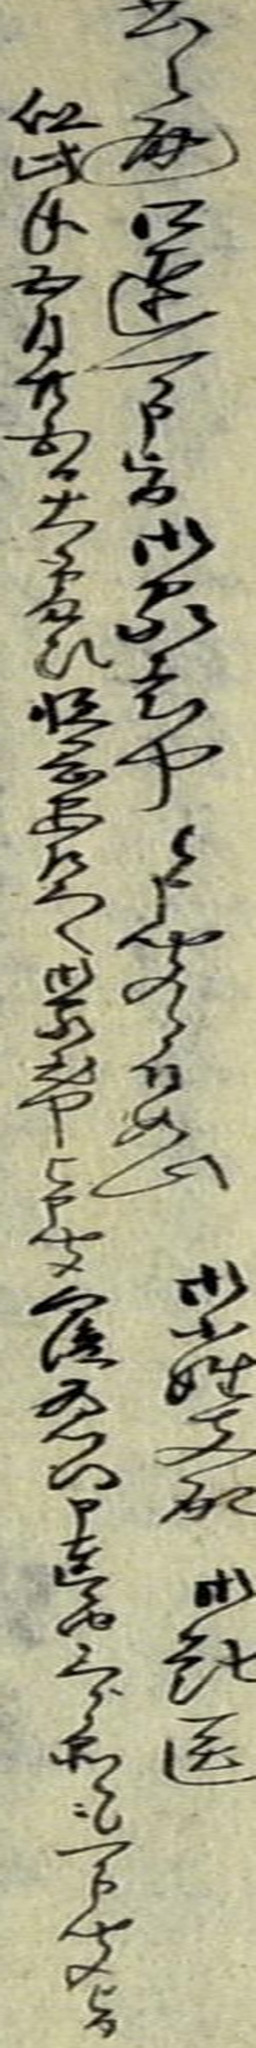但此趣五月廿五日大御番頭恒岡安左衛門へ御家老中被申聞向後為心得申達候由三郎兵衛へも可申聞旨
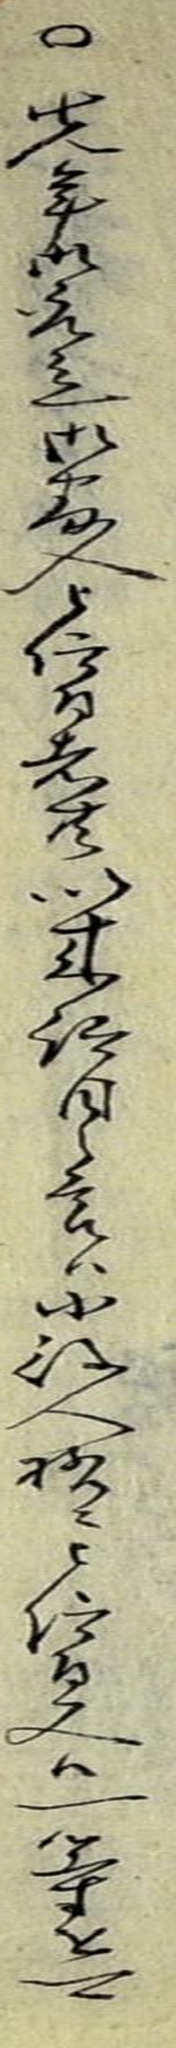〇先年御取立御番入被仰付者共以来跡目之節ハ小役人格ニ被仰付又ハ一等を可
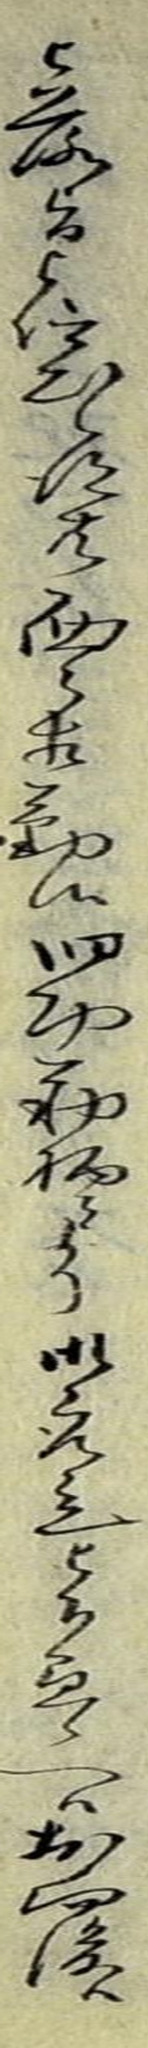被落旨被仰出候得共面々相勤候旧功勤柄ニより御取立被下置候ヘハ於向後ハ
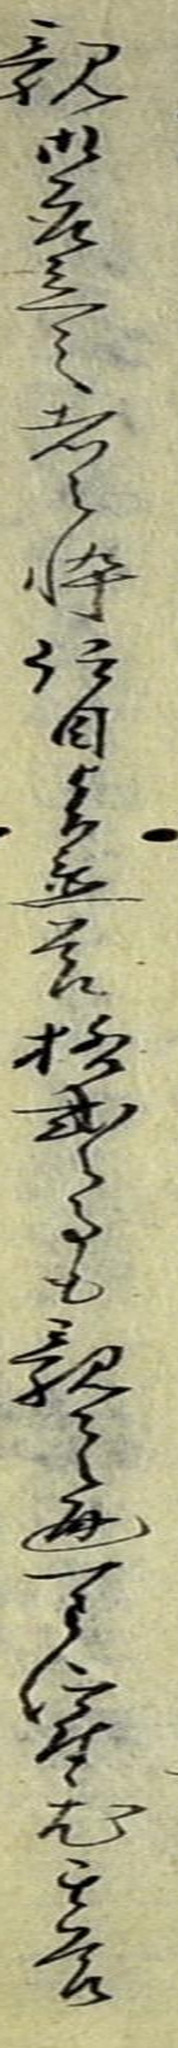親御取立之者之忰跡目被下置節格式之事も親之通可被仰付候尤其節
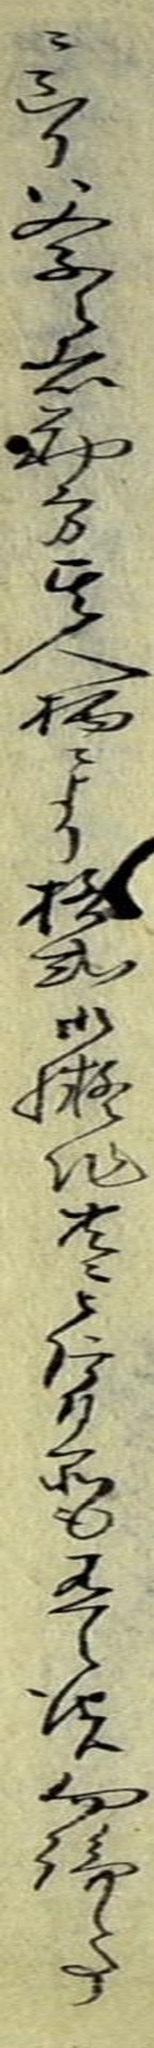ニ至り父子之者勤方其人柄ニより格式御擬作共ニ被仰付品も有之儀ハ勿論之事
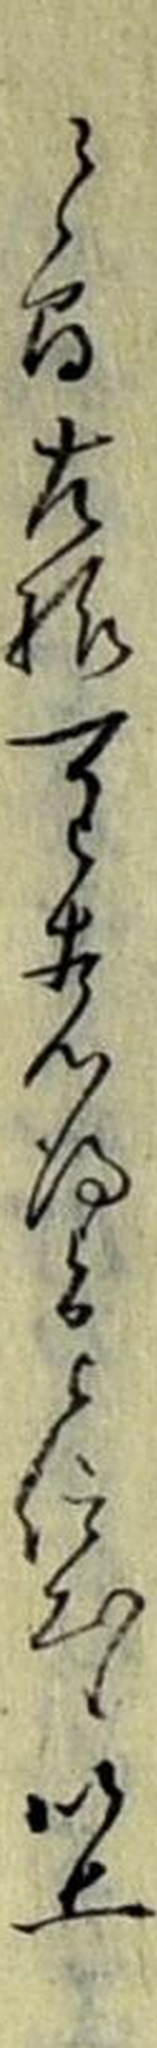ニ候間左様可被相心得旨被仰出候以上

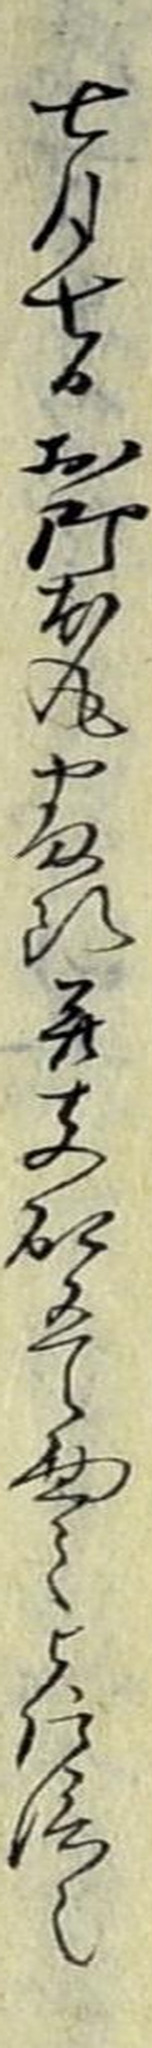七月七日於御本丸番頭并支配有之面々へ被仰渡之
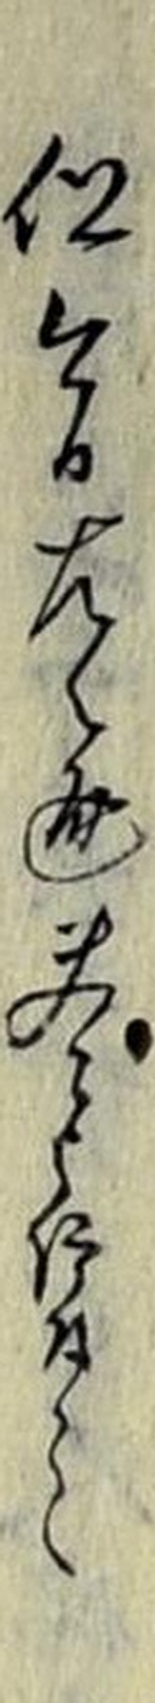但今日左之通夫々被仰付之
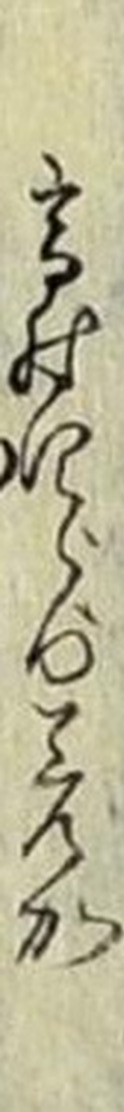高村四郎右衛門差加
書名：命令之部 一
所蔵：福井県文書館 Fukui Prefectural Archives
